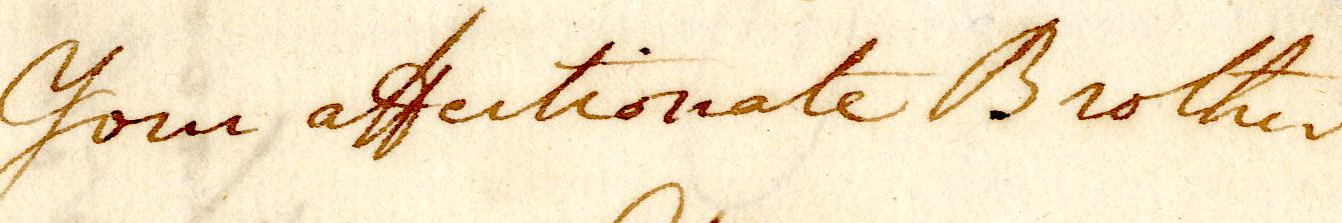Your affectionate Brother
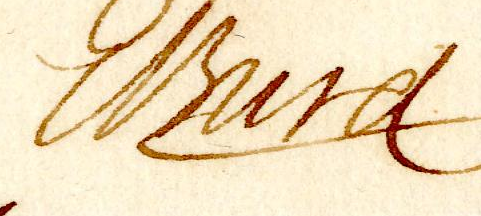E. Burd
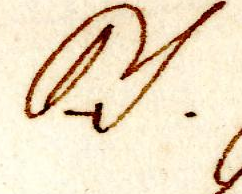PS.
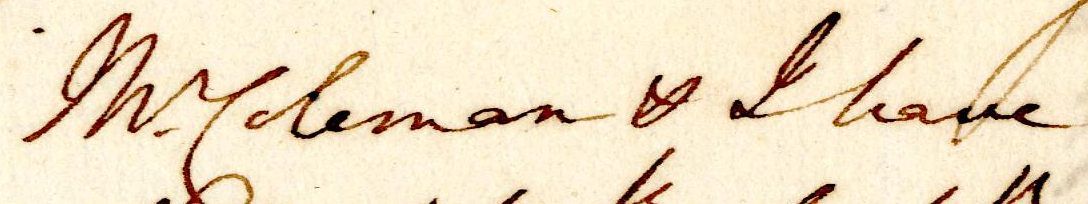M^r. Coleman & I have
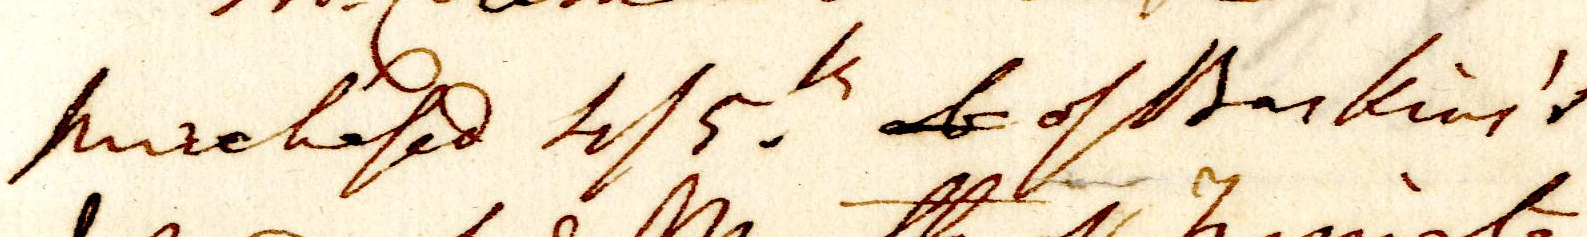purchased 4/5^lb [ab] of Barkins's
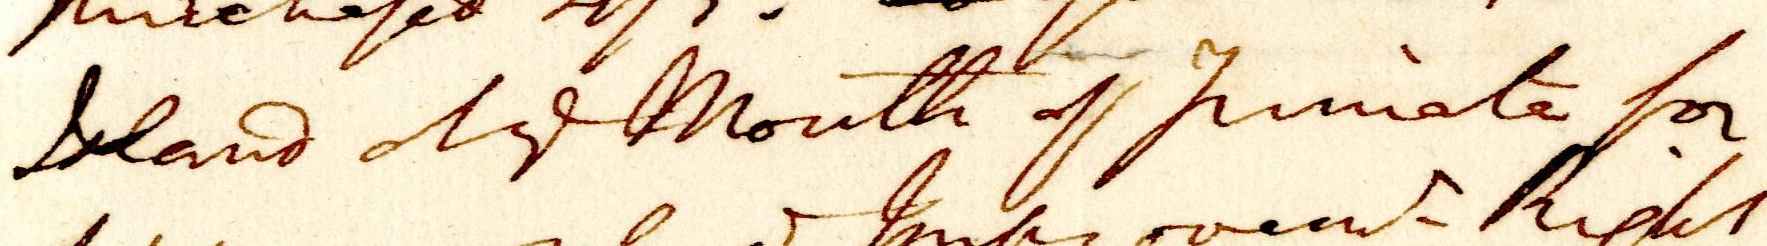Island of y^e Mouth of primate for
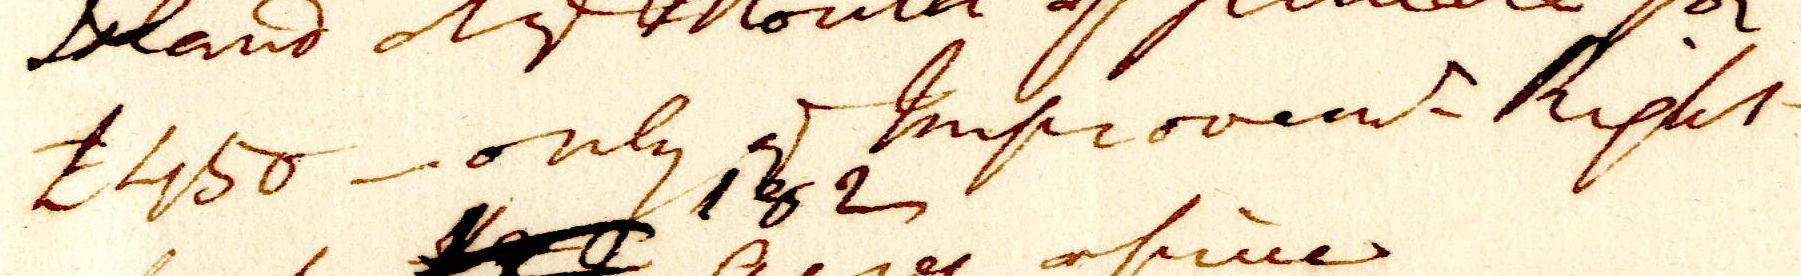£450 - only y^e Improvement Rights
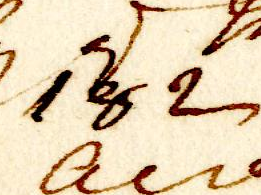182
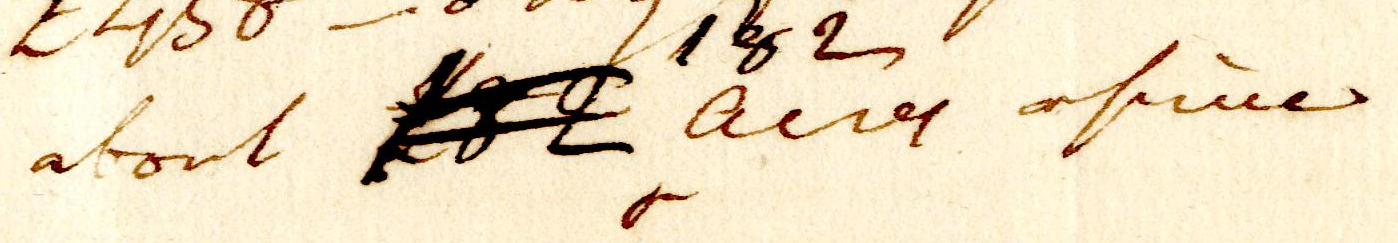about [£82] acres aprice
